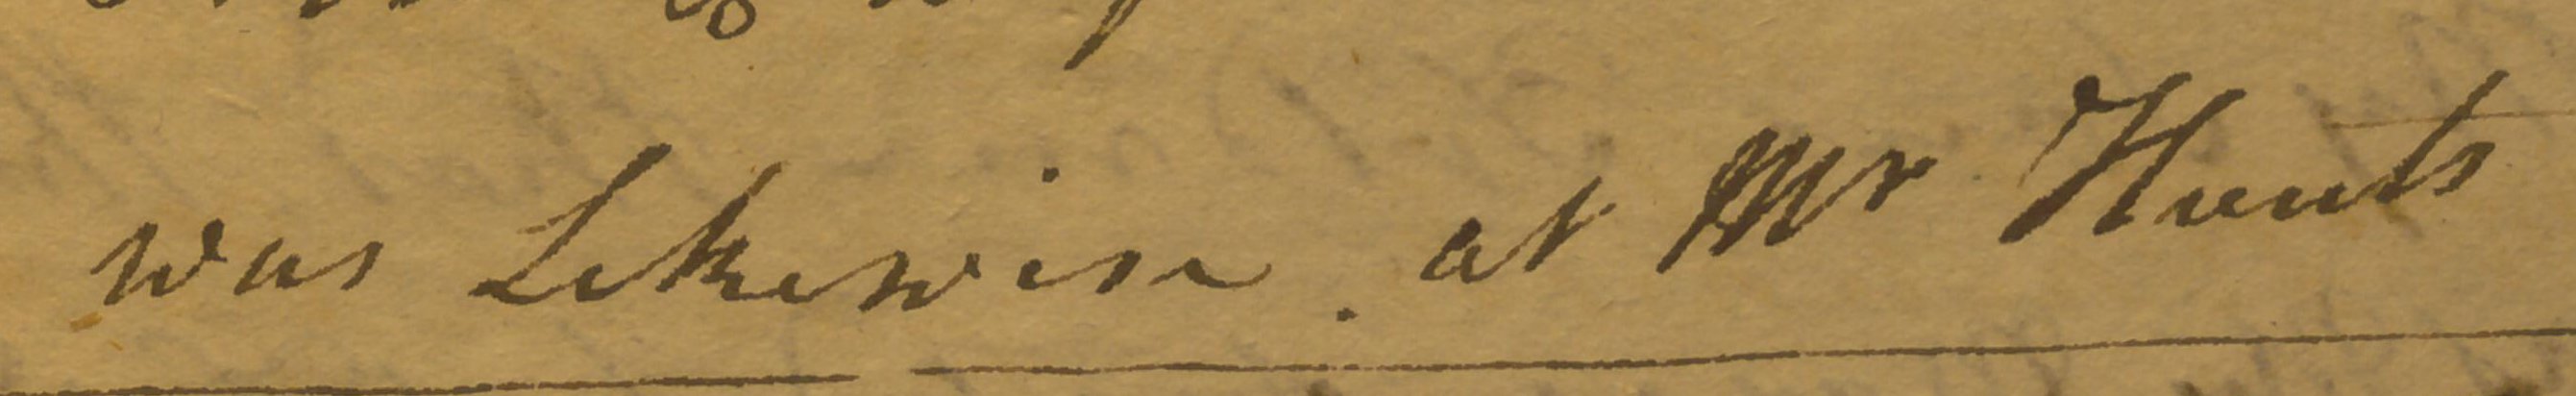was Likewise at M^r. Hunts
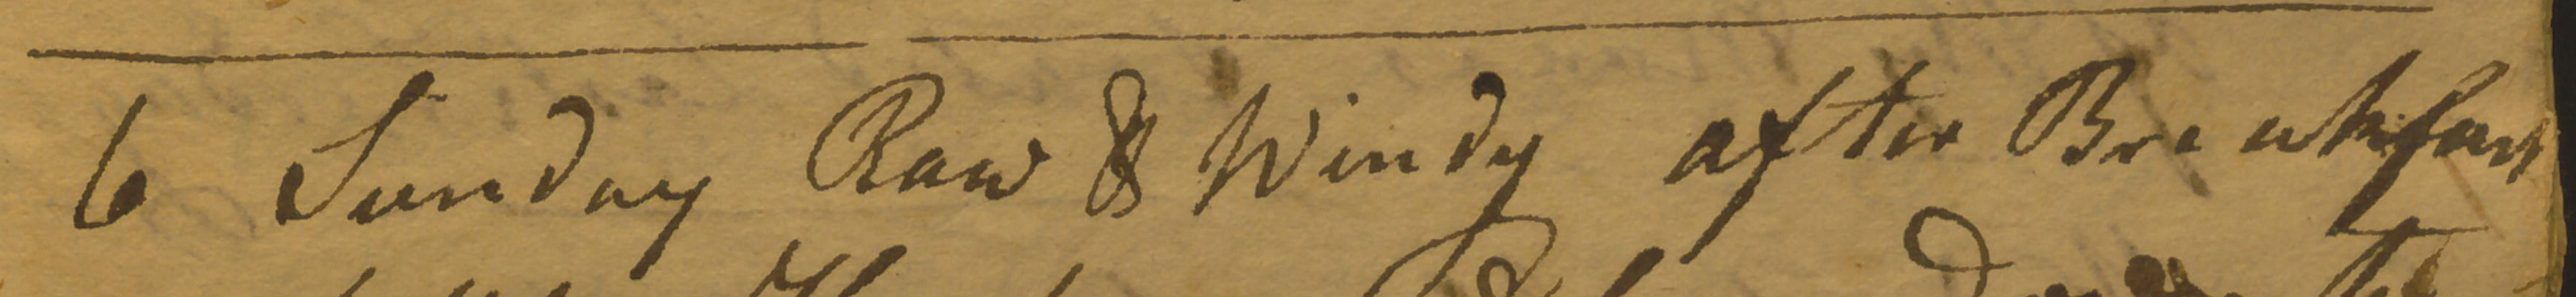6 Sunday Raw & Windy after Breakfast
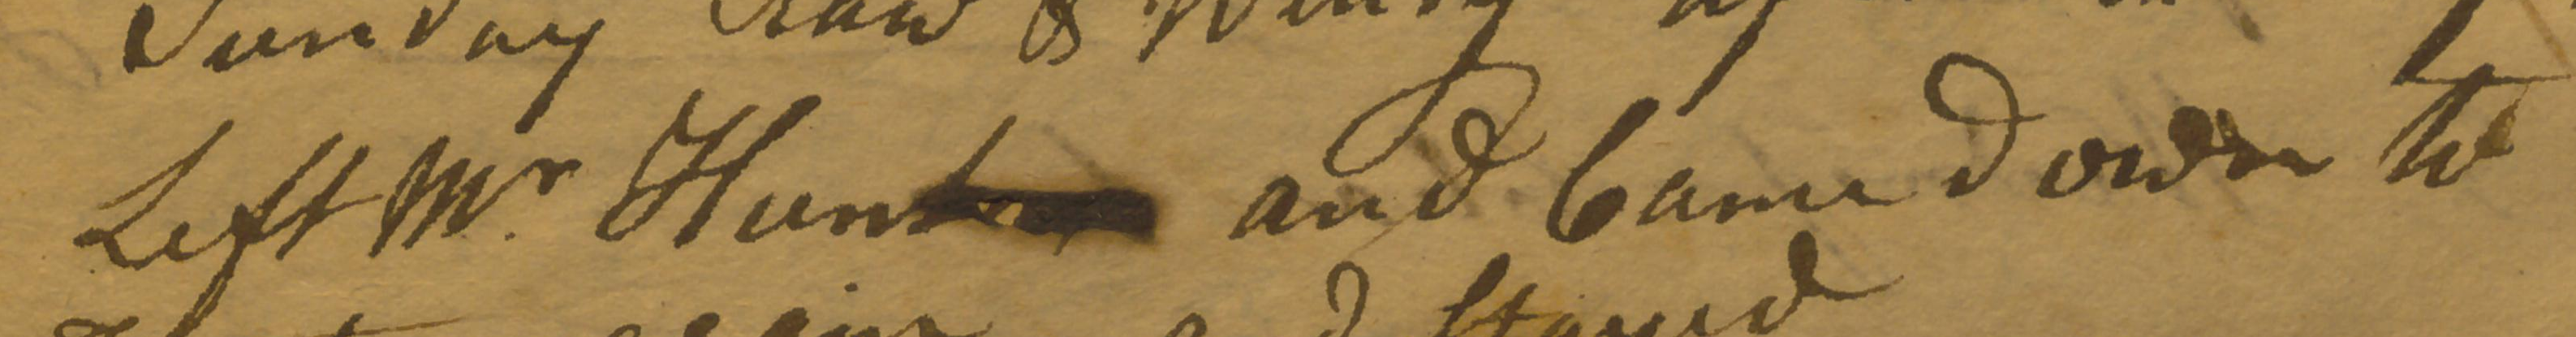Left M^r. Hunt and Came down to
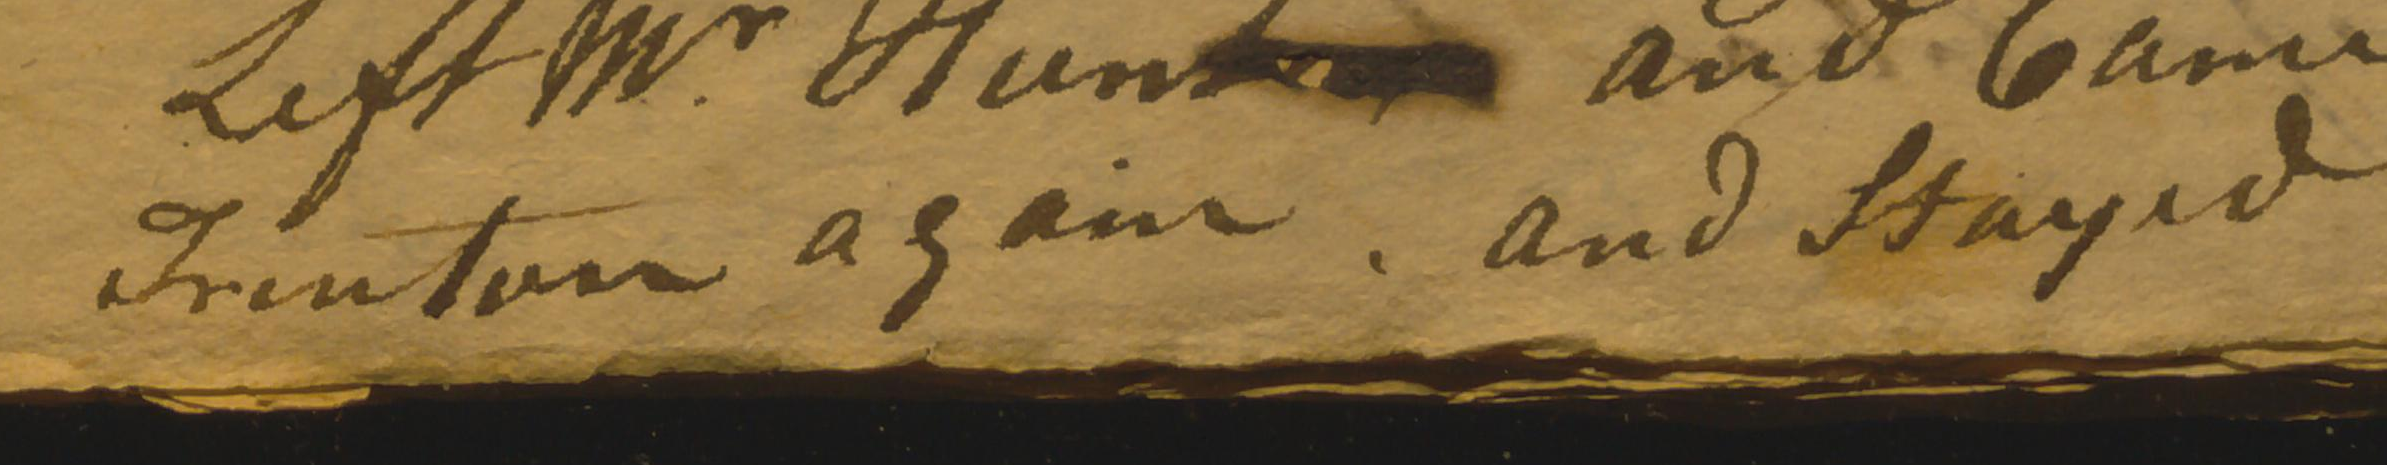Trenton again, and Stayed
